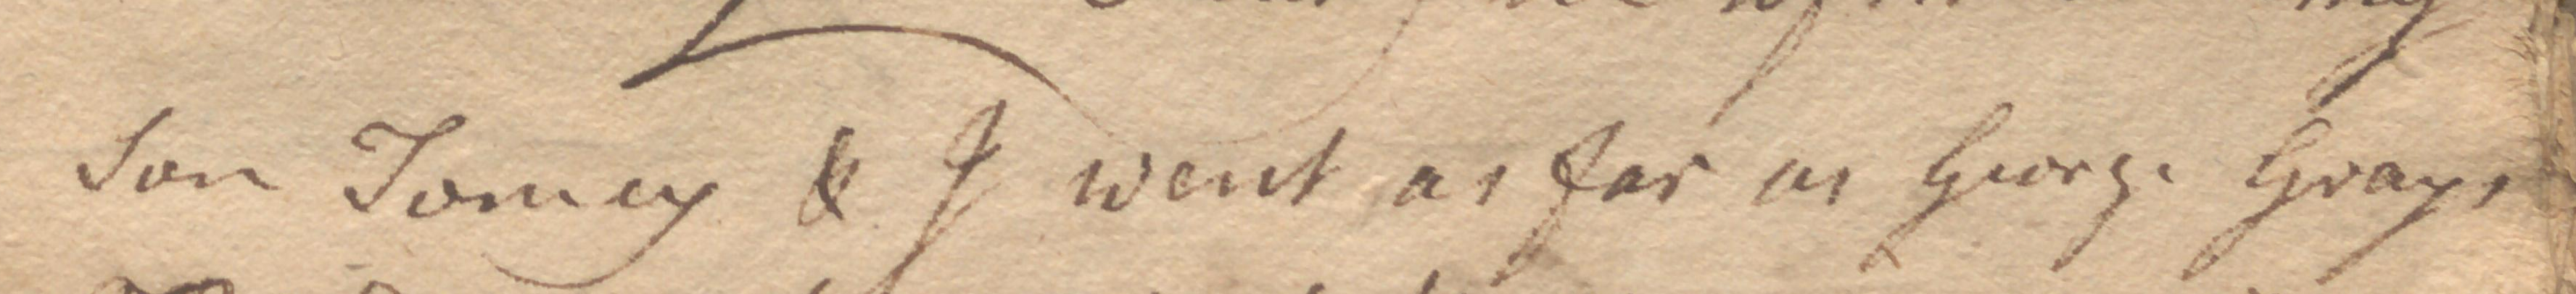Son Tomey & I went as far as George Grays
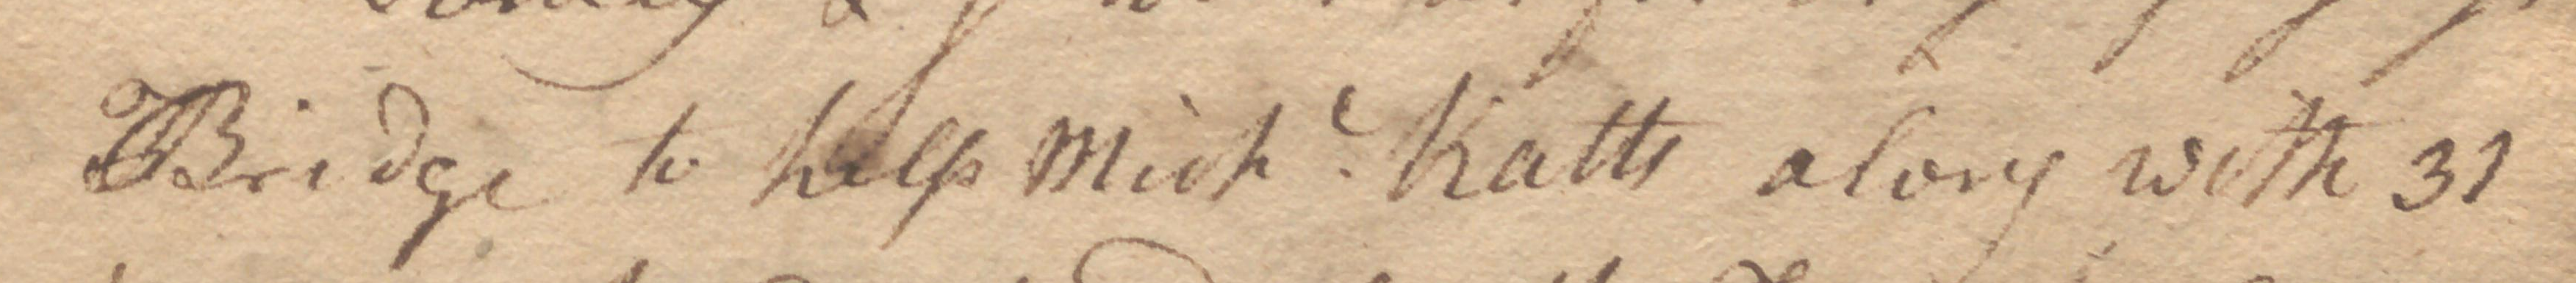Bridge to help Mich^l. Katts along with 31
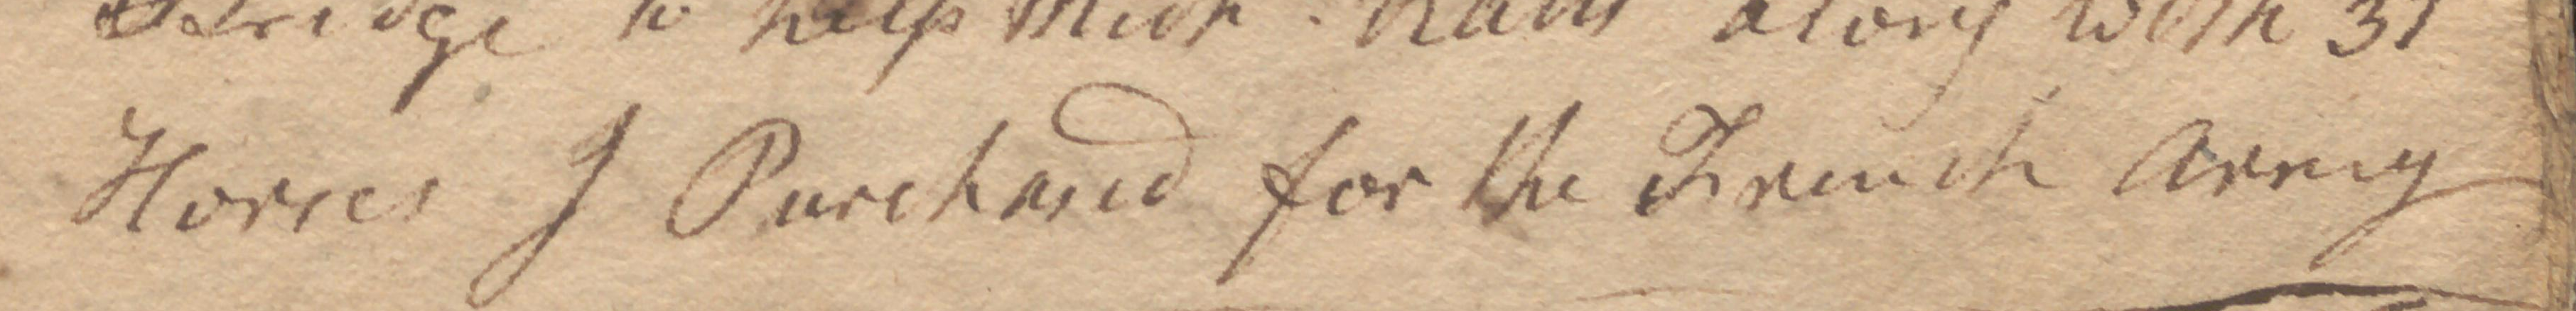Horses I Purchased for the French Army
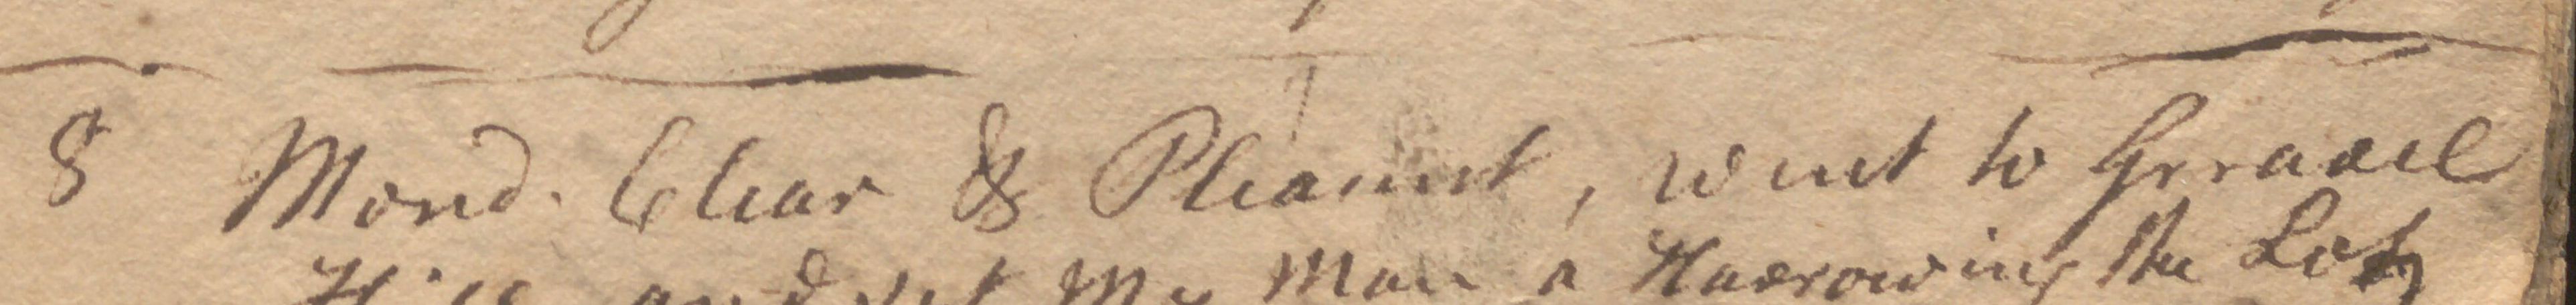8 Mond. Clear & Pleasest, went to Gravel
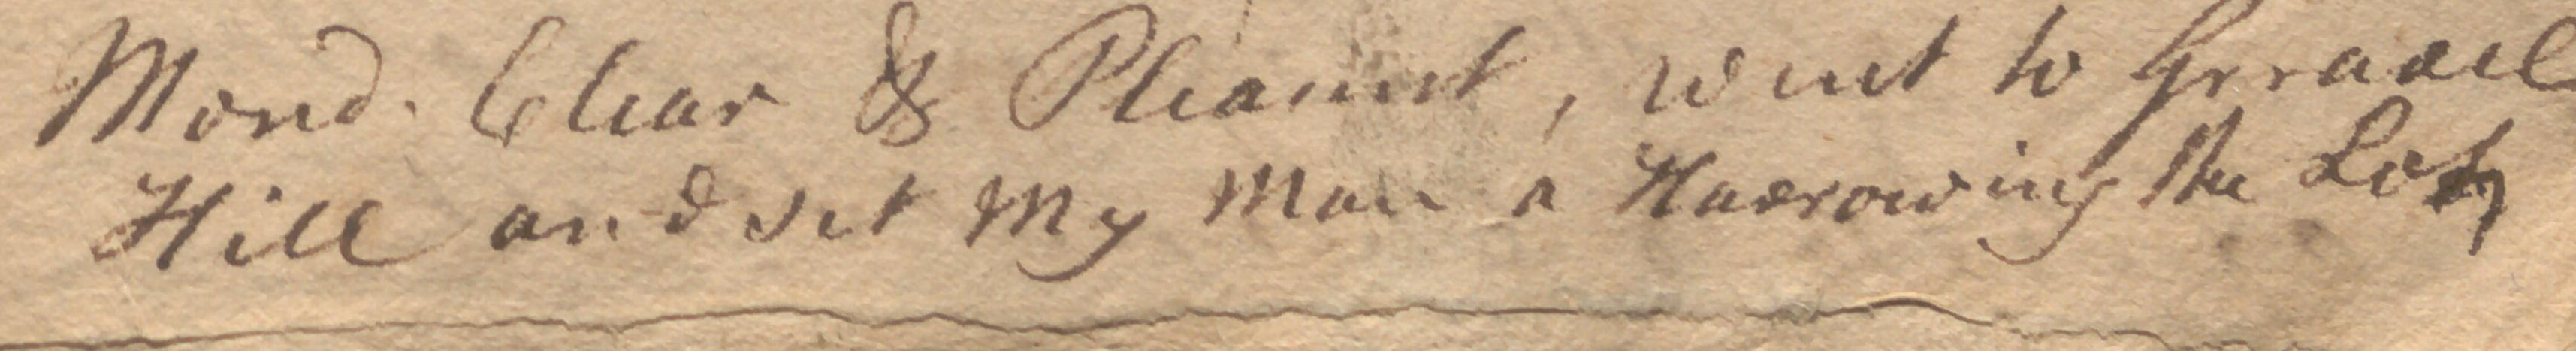Hill and set My Man a Harrowing the Lots
